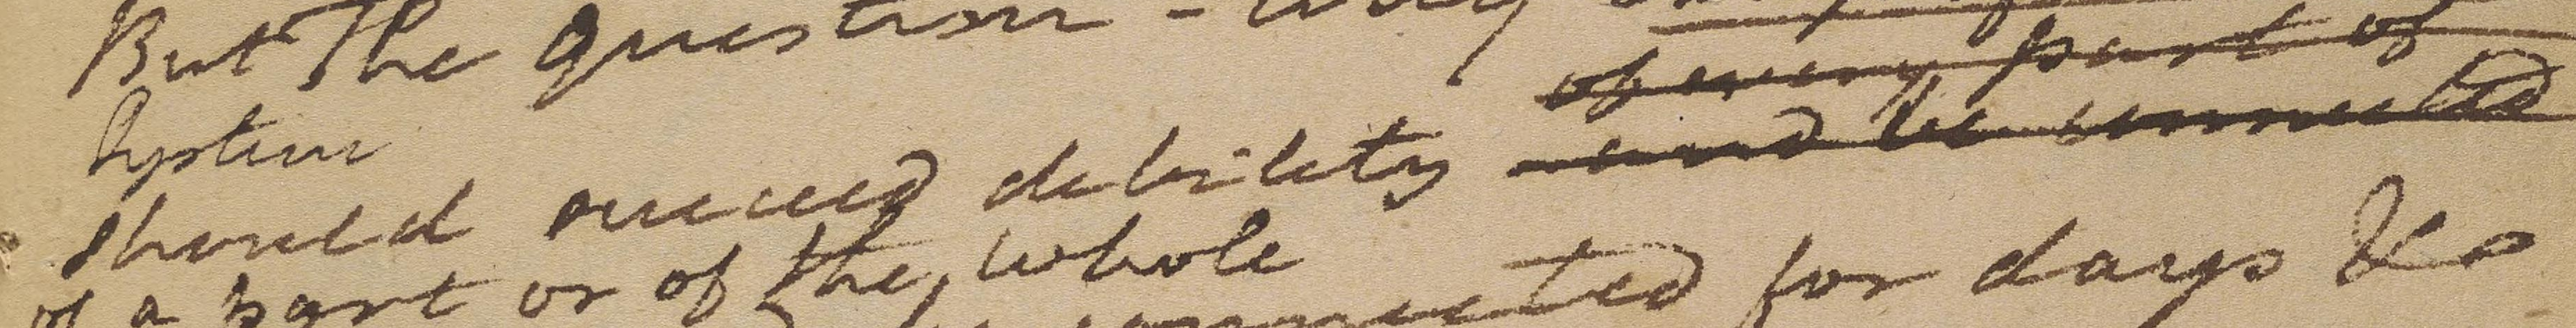should succeed debility [and be connected]
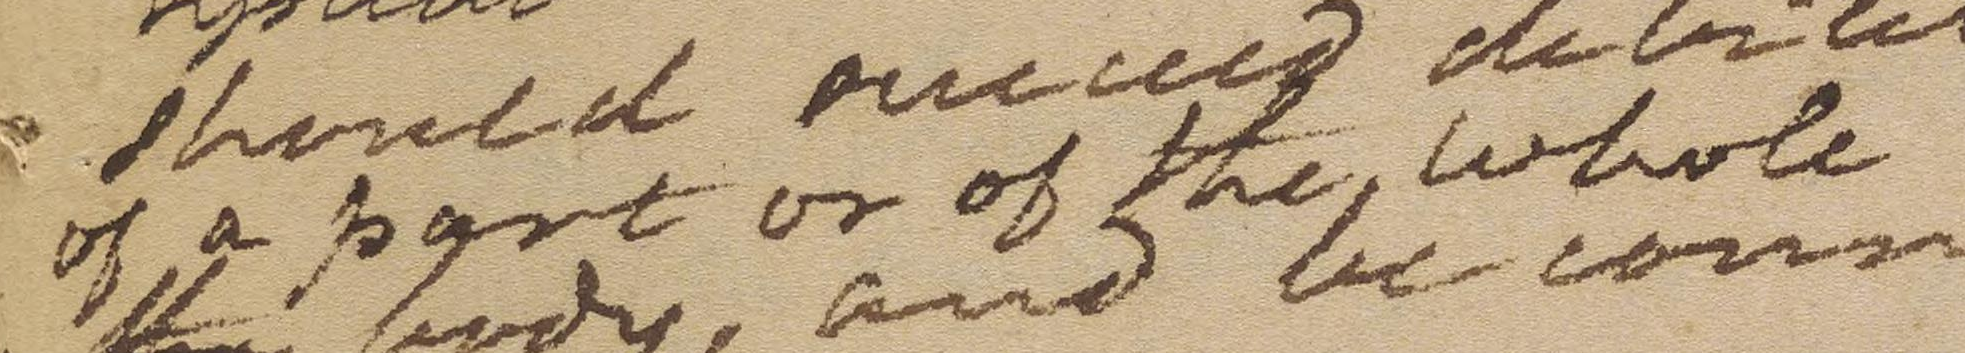of a part or of the whole
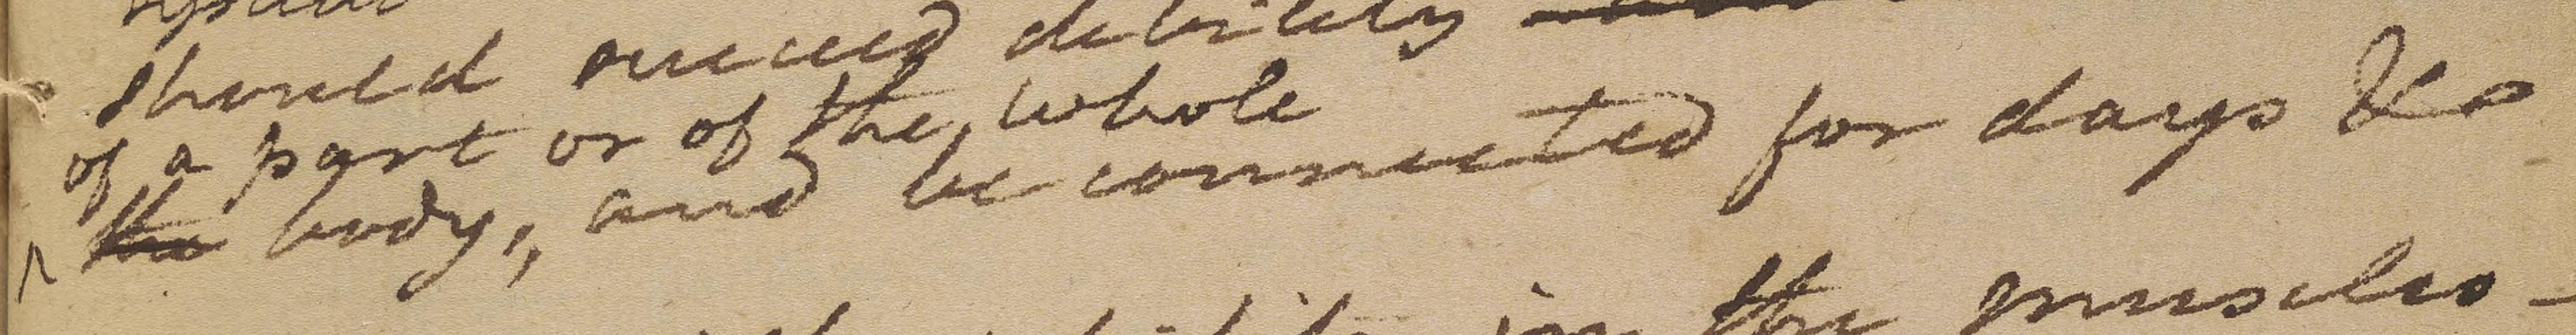^ [the] body, and be connected for days &
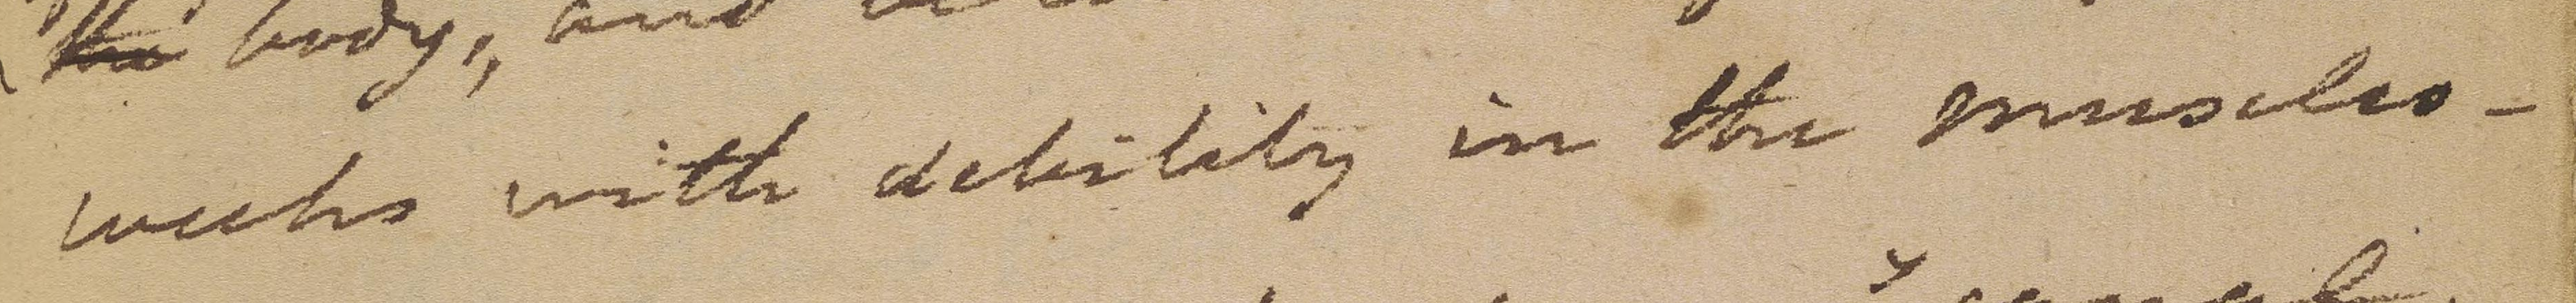weeks with debility in the muscles-
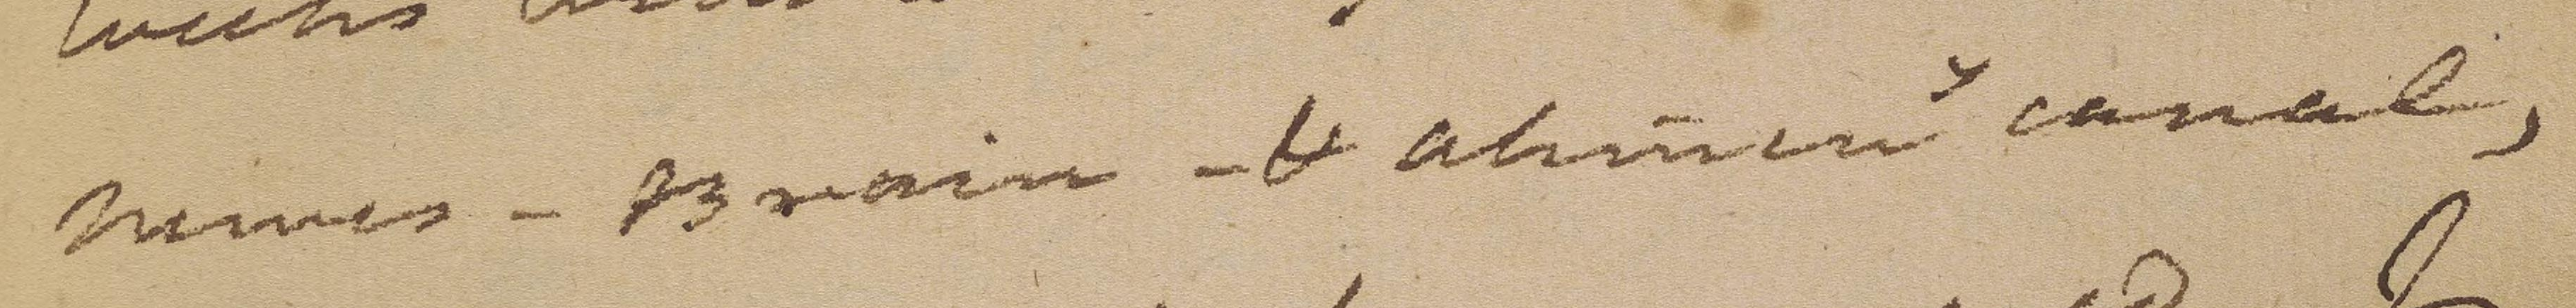nerves- brain- & alimen^y canal,
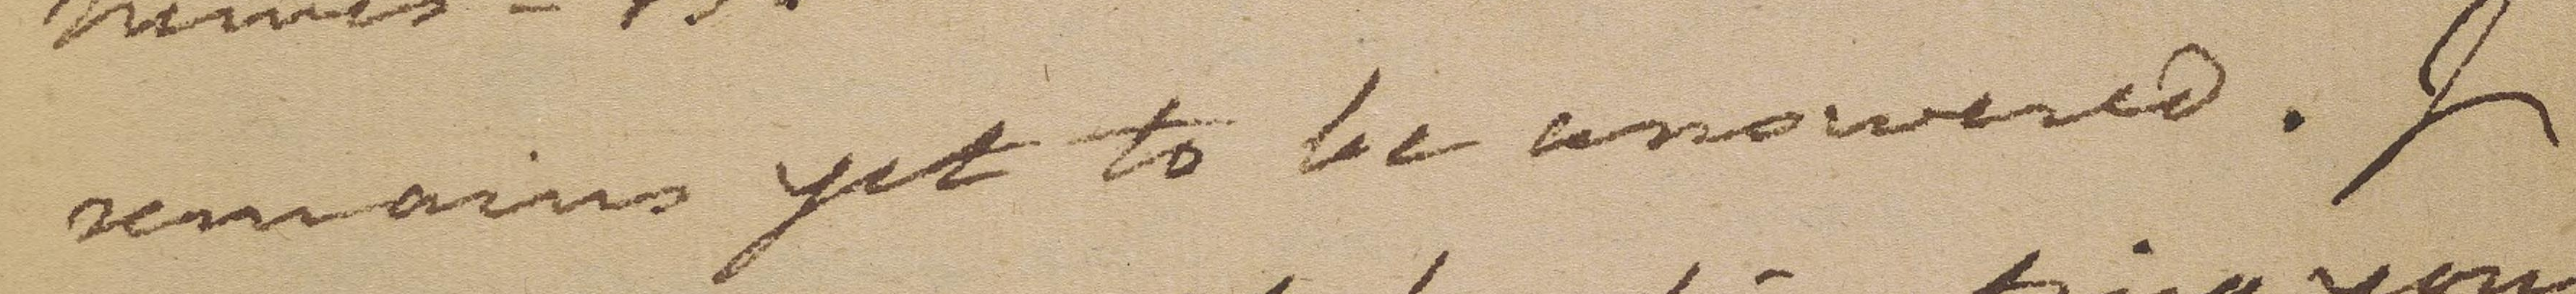remains yet to be answered. I
